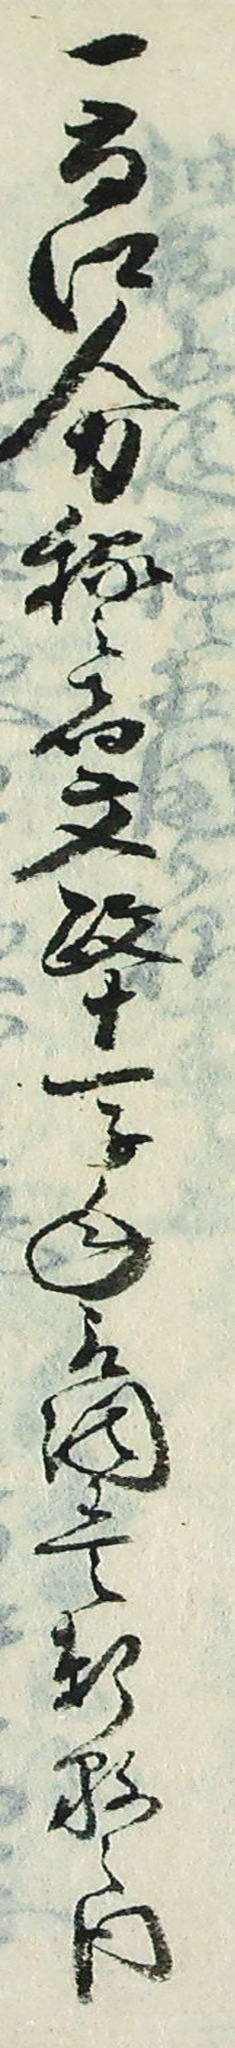一市郷人力稼之者文政十一子年取調有之軒数之内
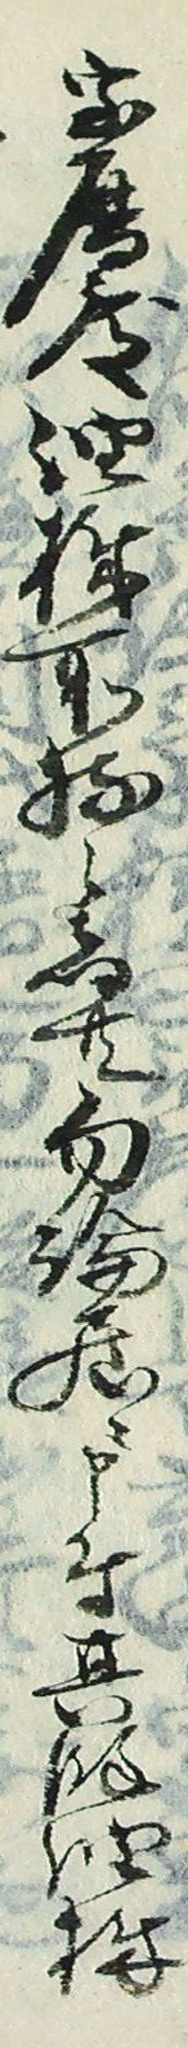宝暦度油株所持之者共勿論居々申付其余油株
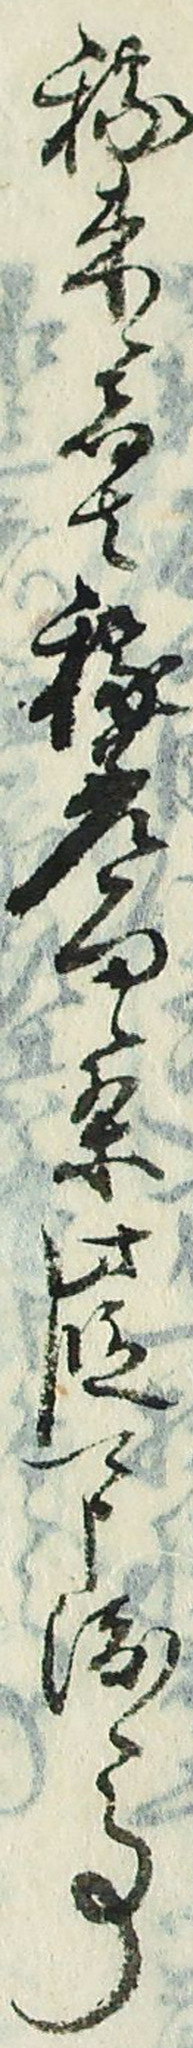稼来候者者稼差留候条此段可申渡候事
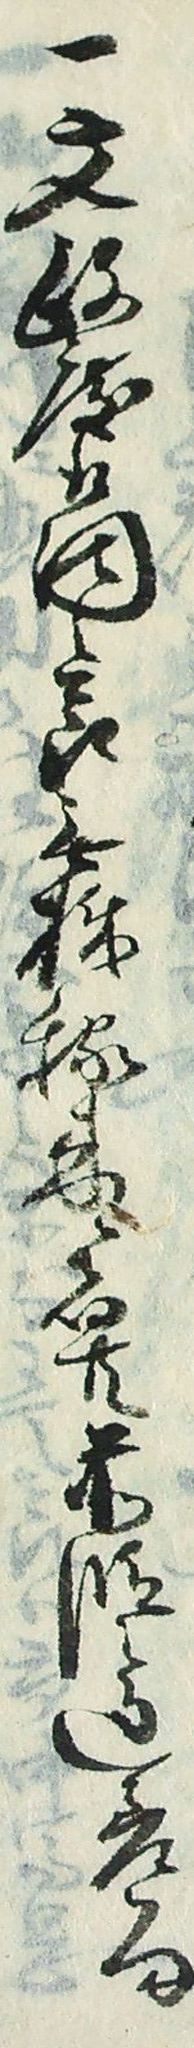一文政度取調候節無株稼来候者共前段之通差留
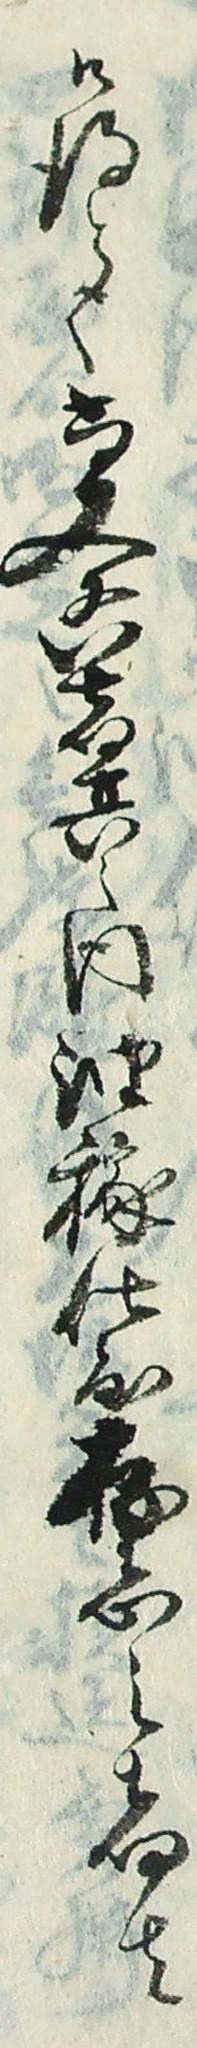候得とも尚又右者共之内油稼仕度存志之者者
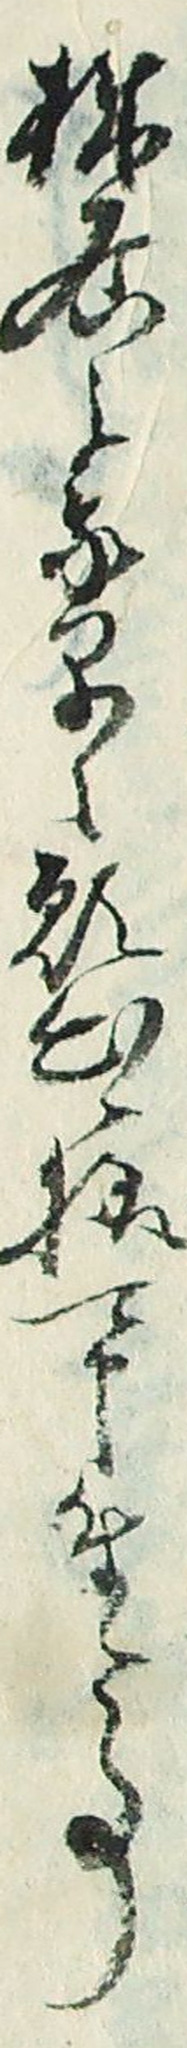株居之義早々願出候様可申付候事

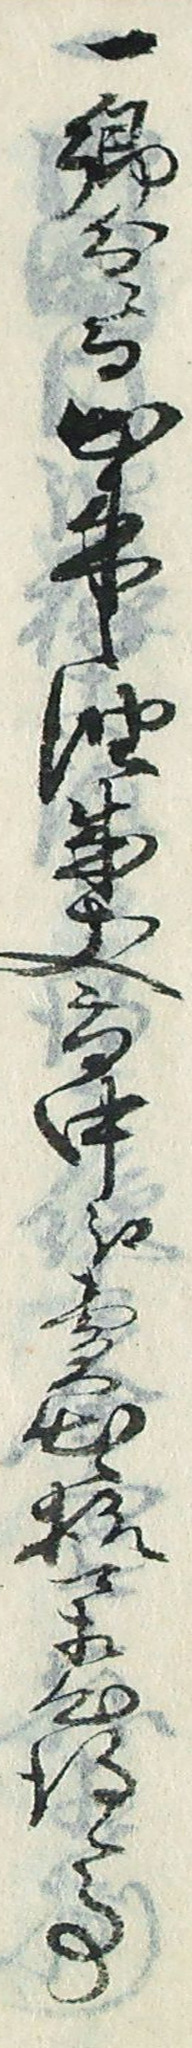一郷分に而出来油成丈市中江売出候様相心得候事
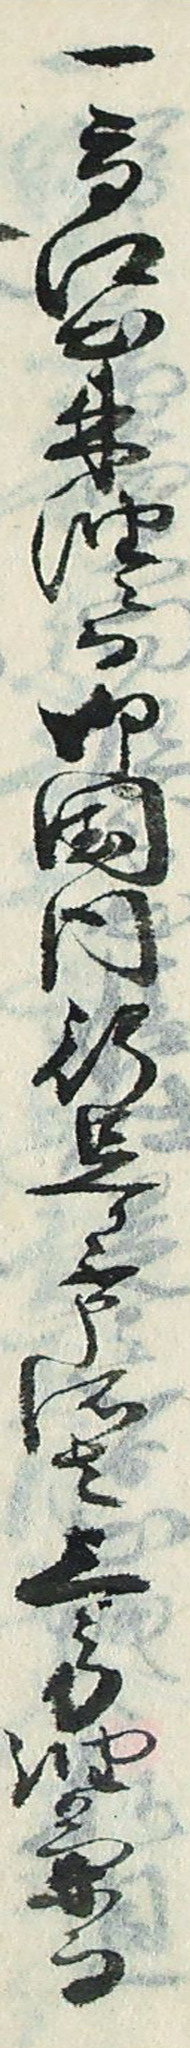一市郷出来油に而御国内行足り不申所者上方油兼而
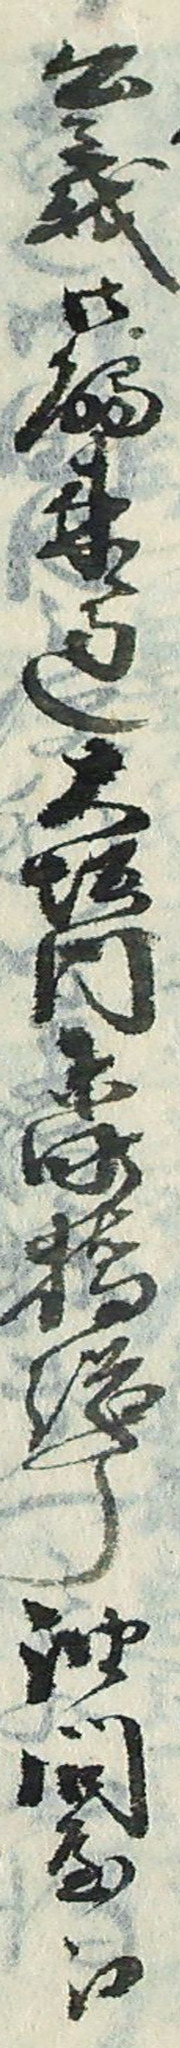公儀御触来候通大坂内本町橋詰丁油問屋江
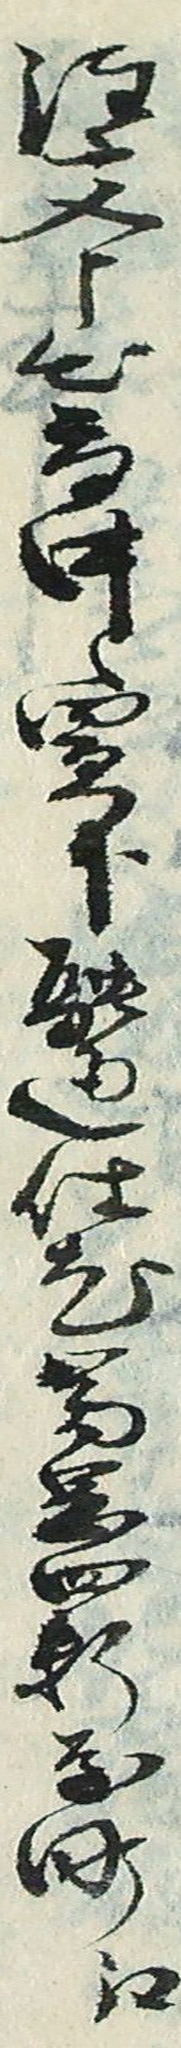注文申出市中へ買下融通仕尤富岡四軒屋町江
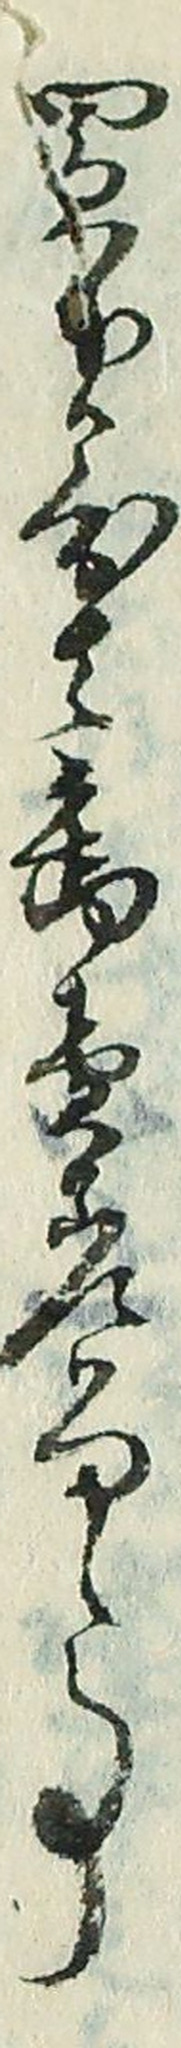買下候分者卸売差留候事
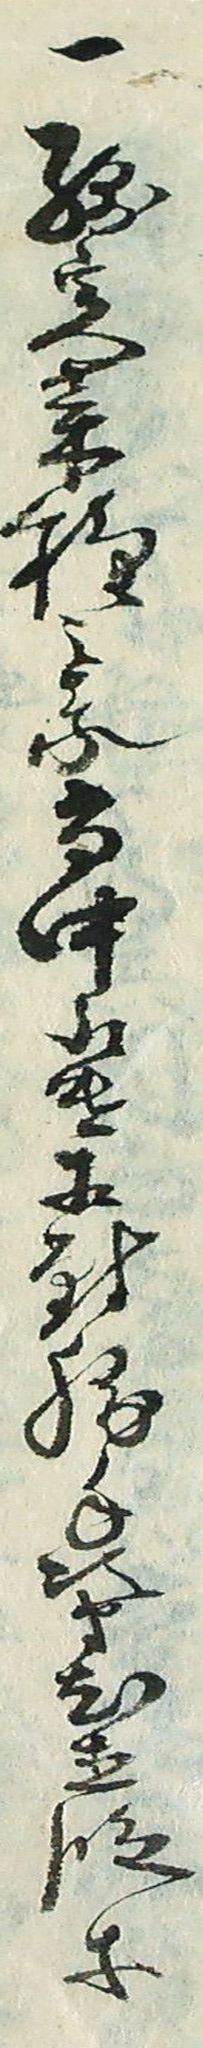一綿実菜種之義市中取遣相対勝手次第尤直段等
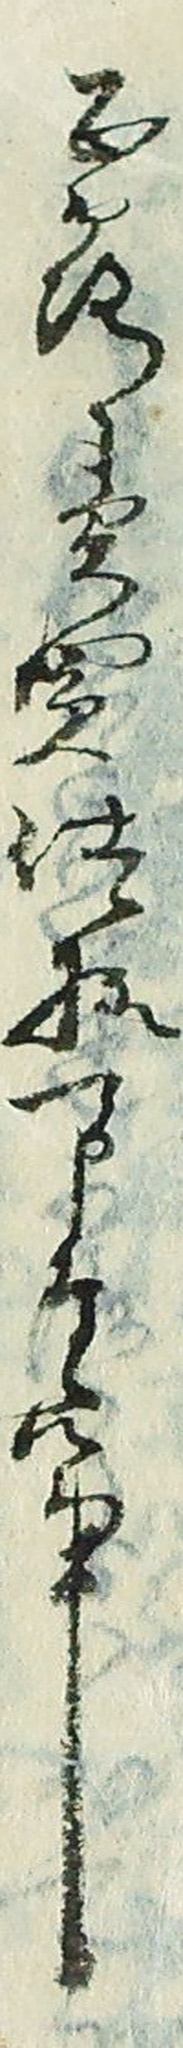正露売買仕候様可申付候事
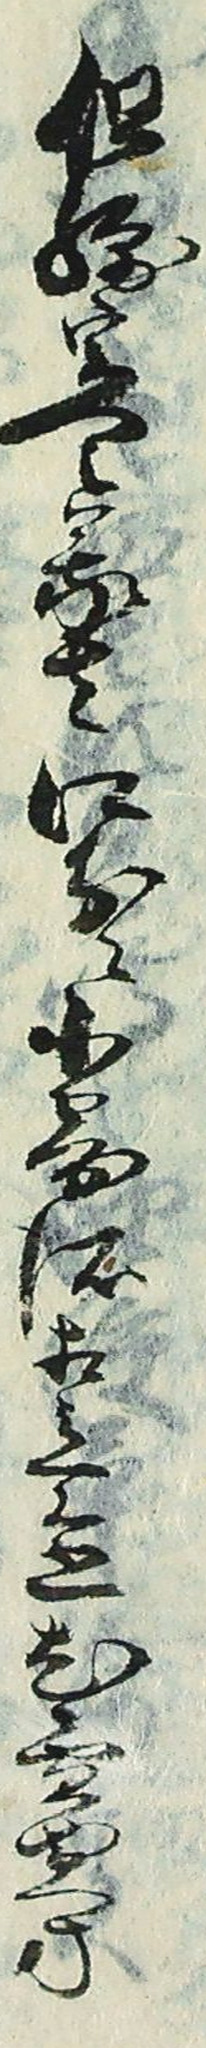但綿実之義者郷分に小寄所相立置尤売買方
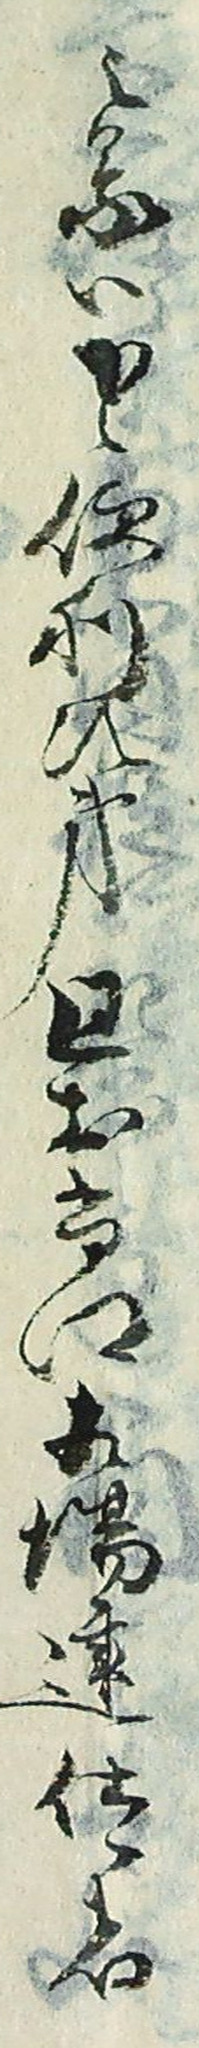之儀者下々便利次第且於市郷相場相建仕候者
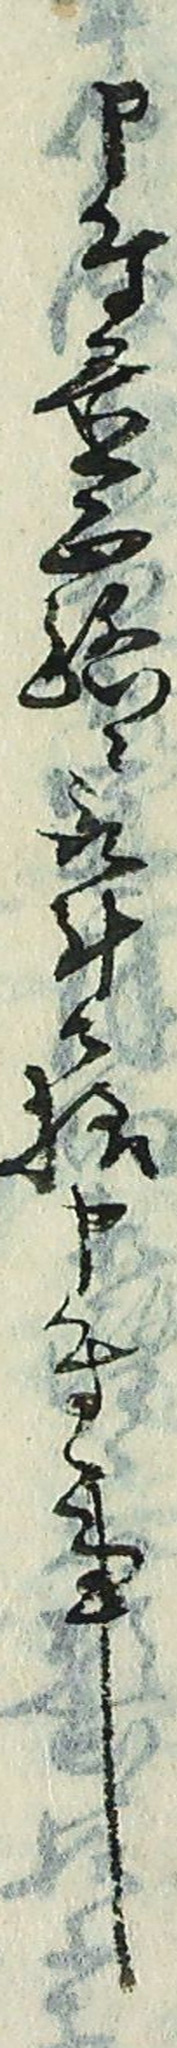申付置正路に取計候様申付候事
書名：油稼御取究ニ附御箇條書テ以被仰渡南北同役申談御答書控
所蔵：鳴門教育大学 Naruto University of Education
